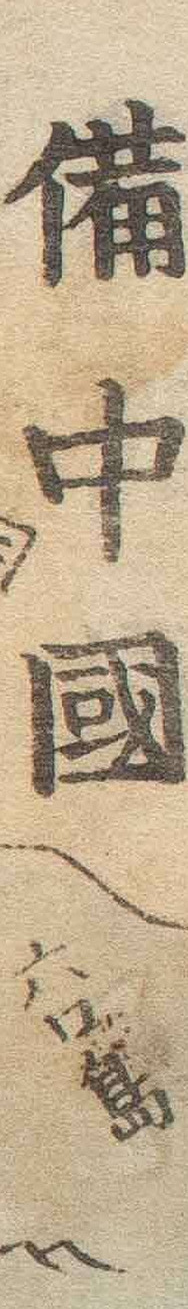備中国
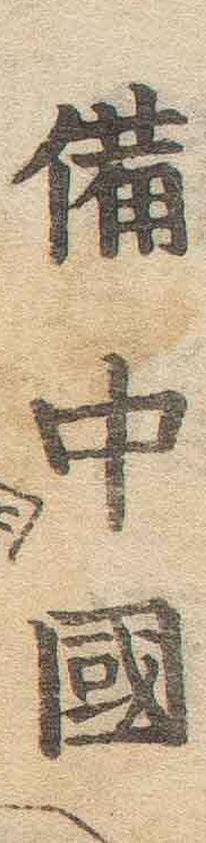備中国
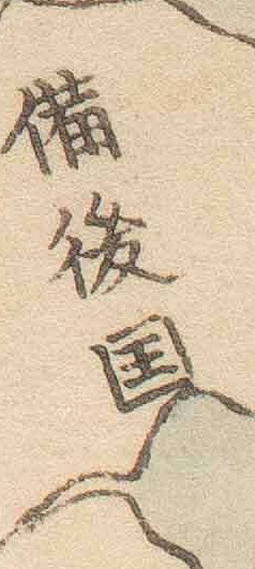備中国

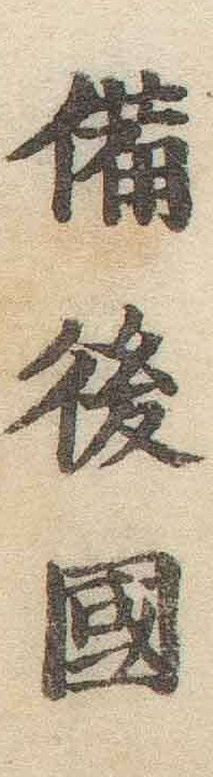備後国

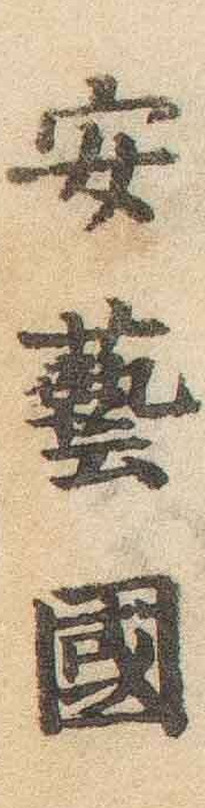安芸国

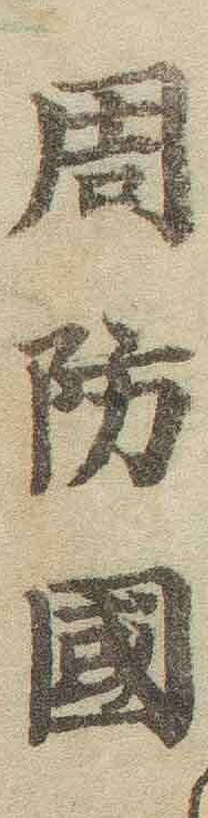周防国

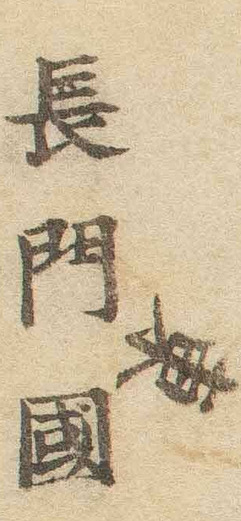長門国
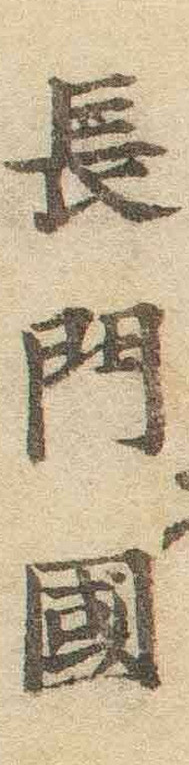長門国

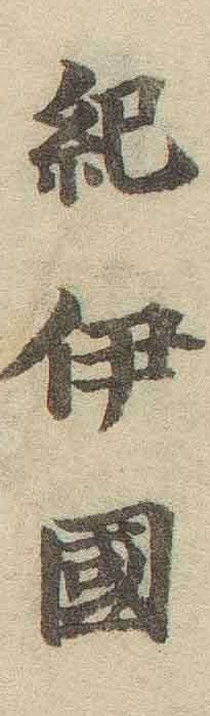紀伊国

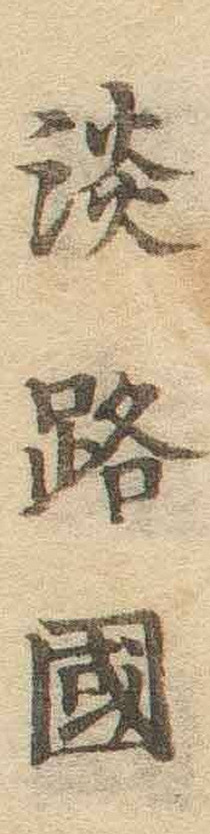淡路国

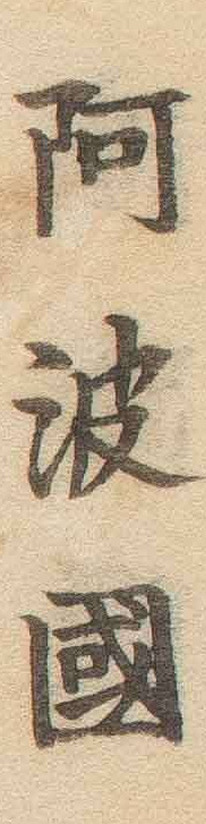阿波国

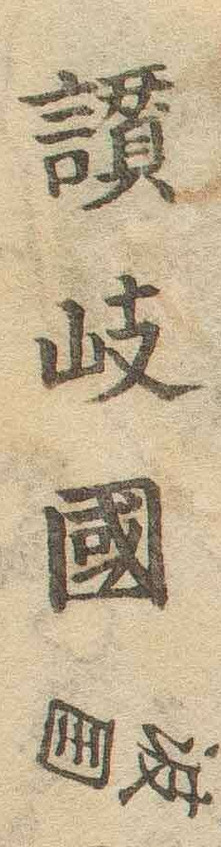讃岐国

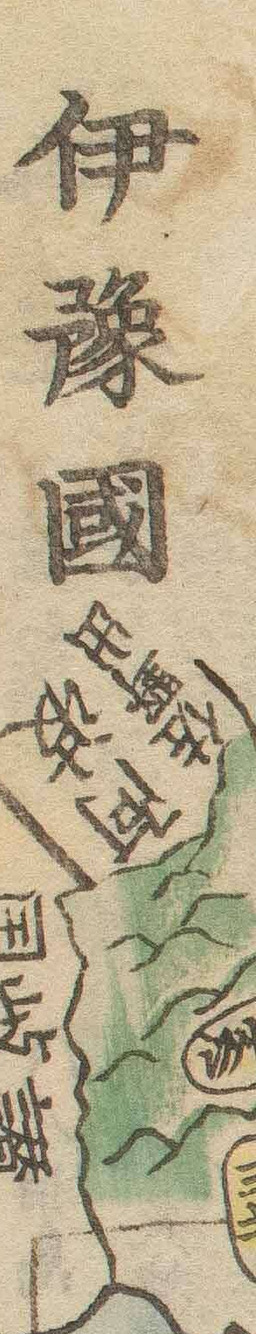伊予国

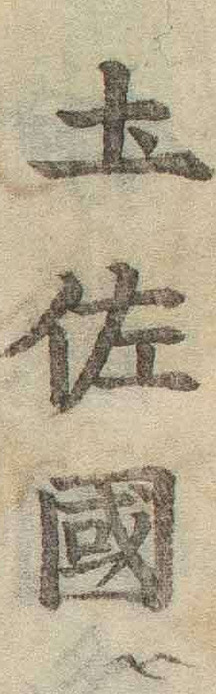土佐国

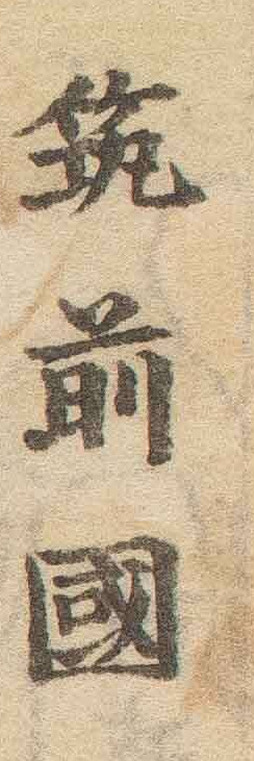筑前国
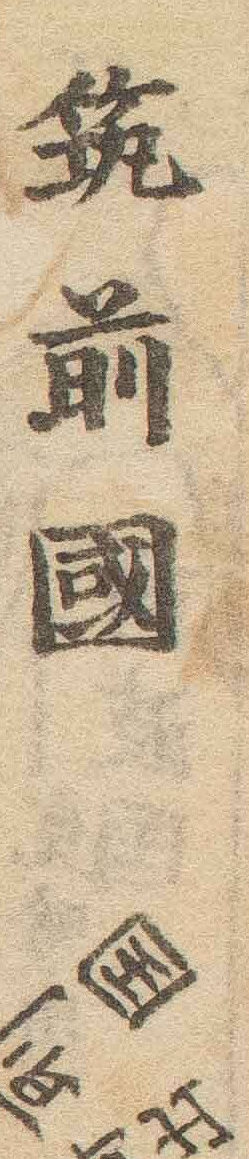筑前国
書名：国郡全図
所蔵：東京学芸大学附属図書館 国文学研究資料館
